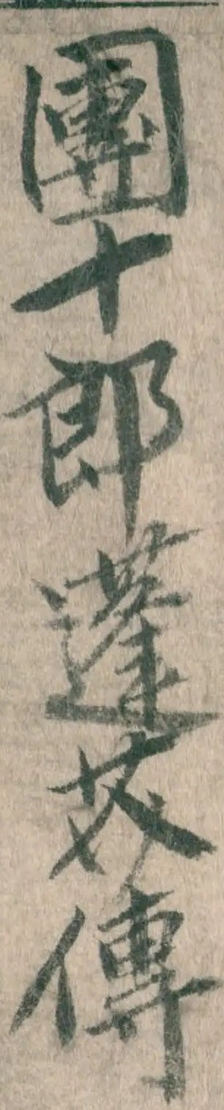団十郎蓬芥伝

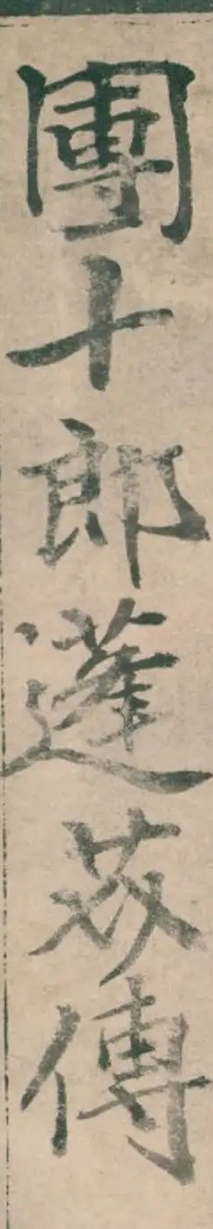団十郎蓬芥傳

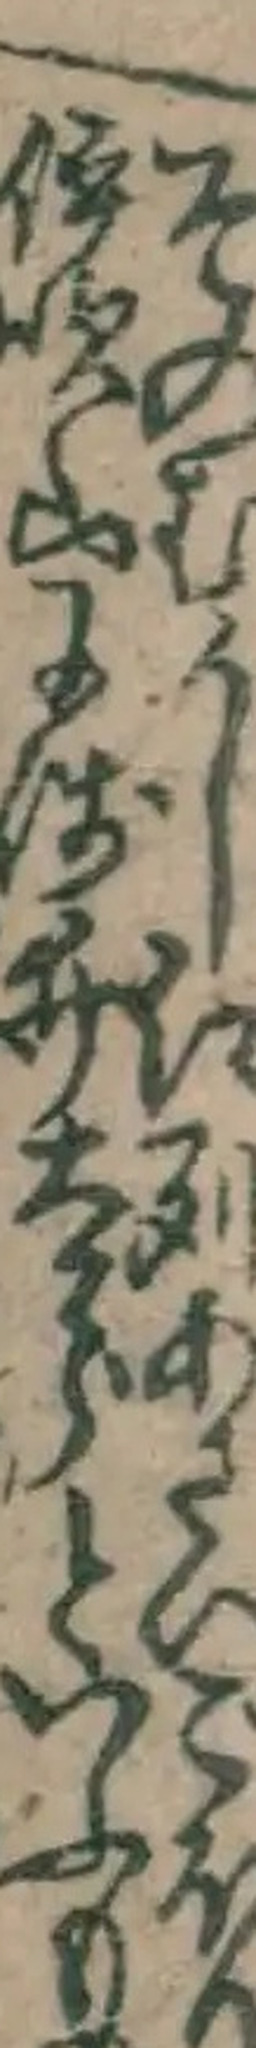伊吹山に浅井太郎といふもの
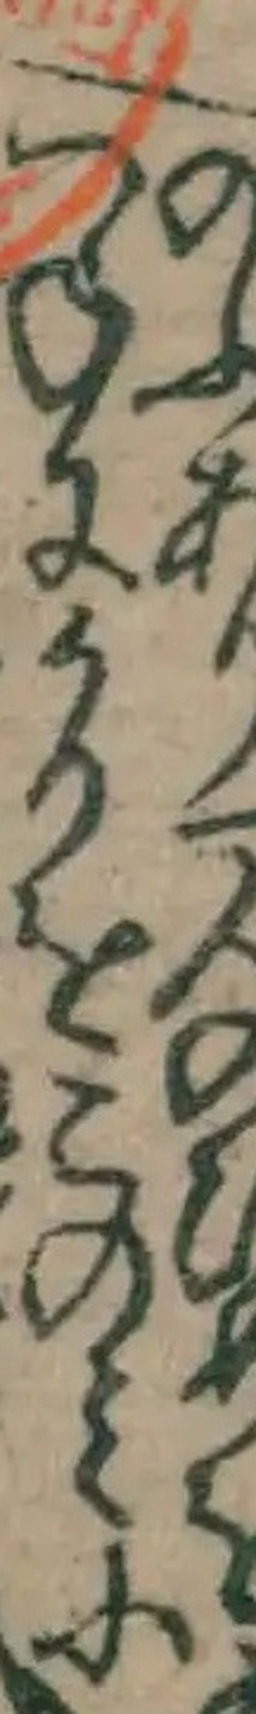つねにかりをこのみふ
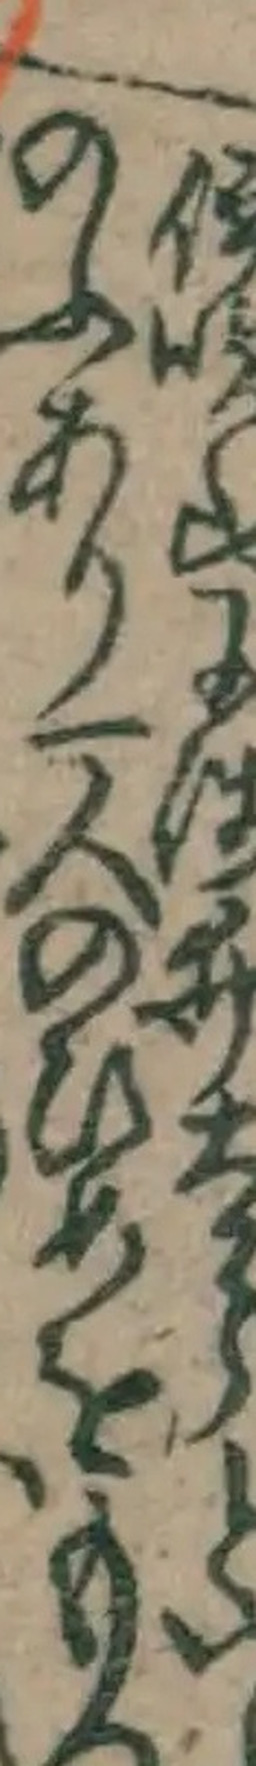のふあり一人のひめをもつ
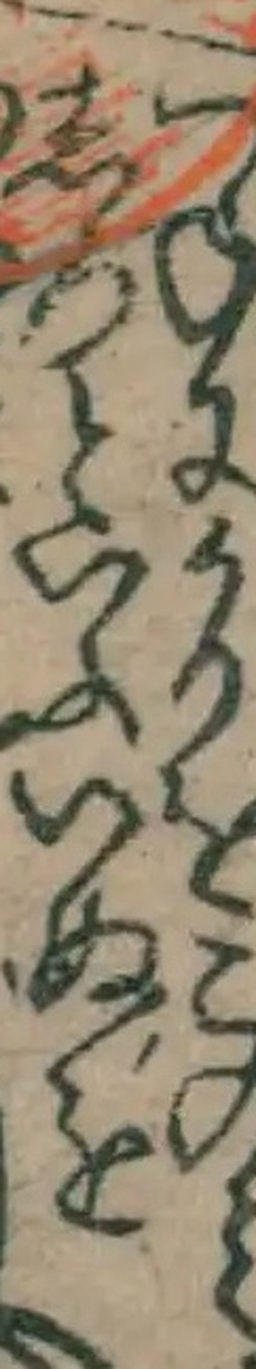しつといふいぬを
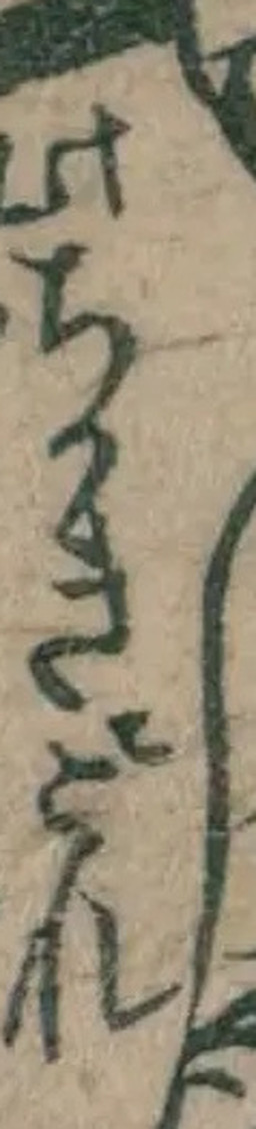此ちかきにとれ
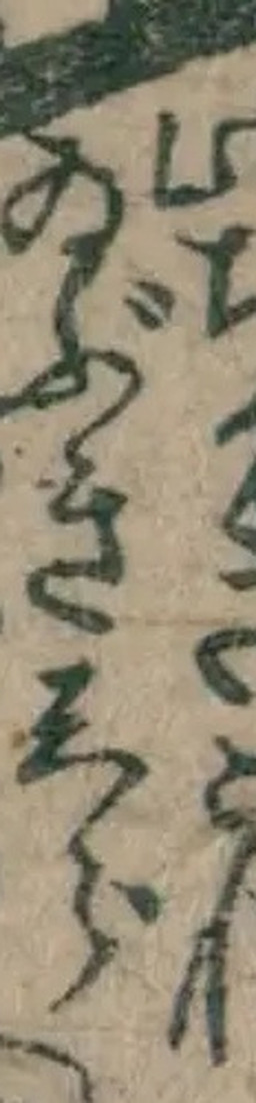ゐぶき三郎
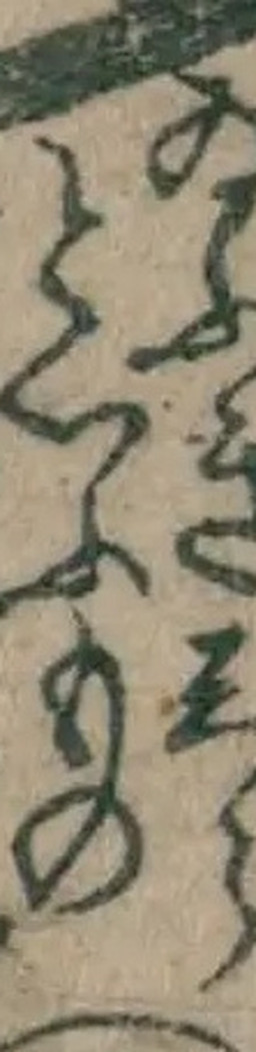といふもの
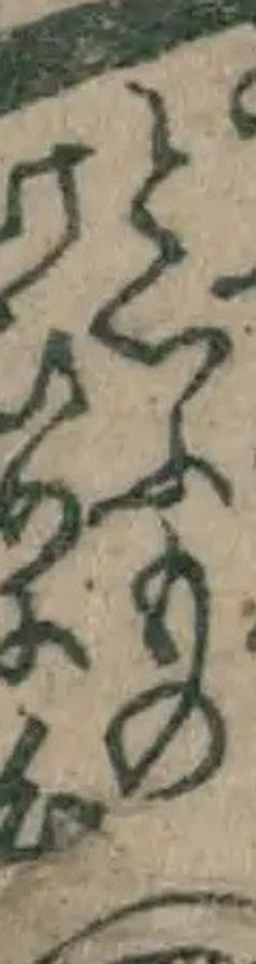此ひめに心
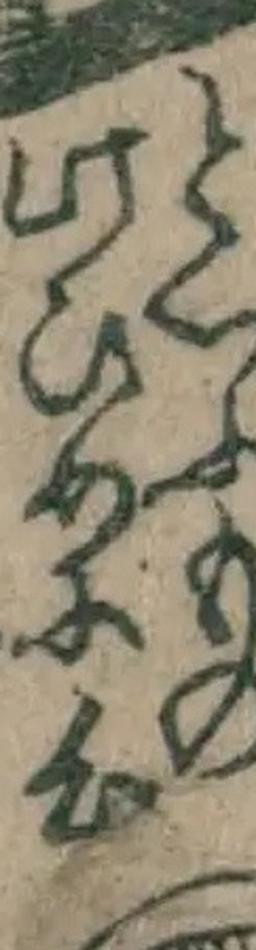此ひめに心
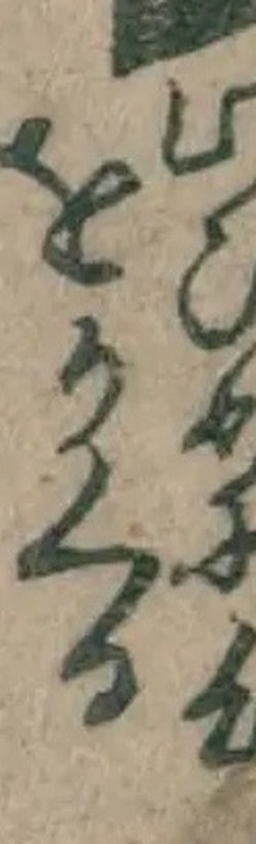をかくる
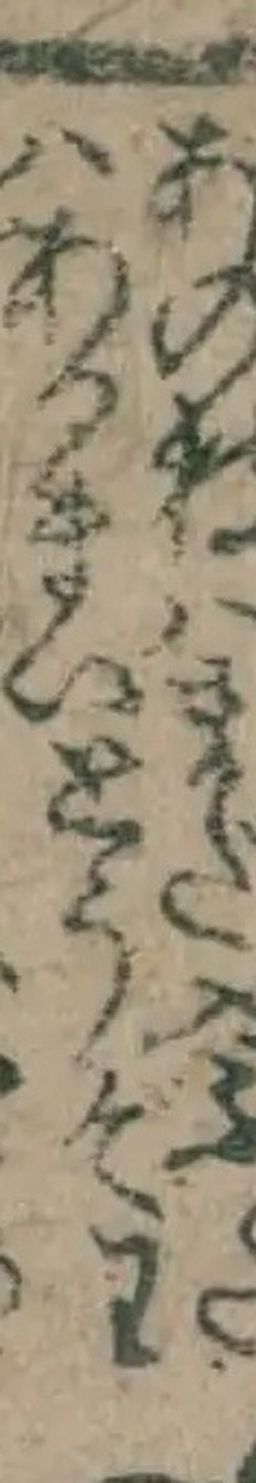はあるまいとうそわ
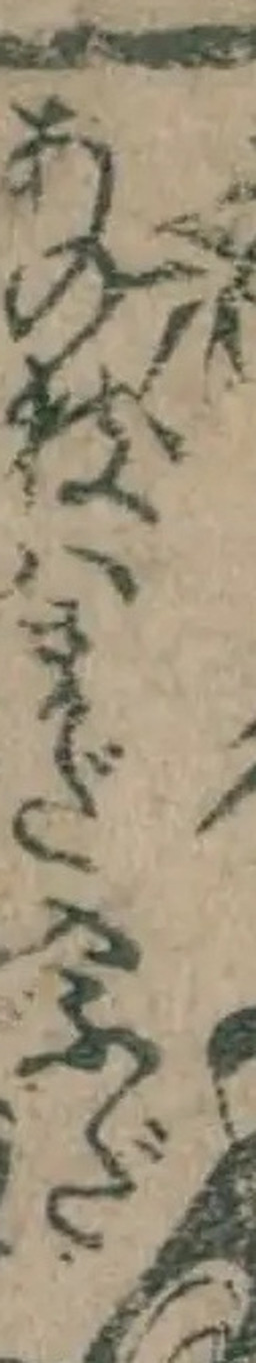あの妓はまだ入ふだ
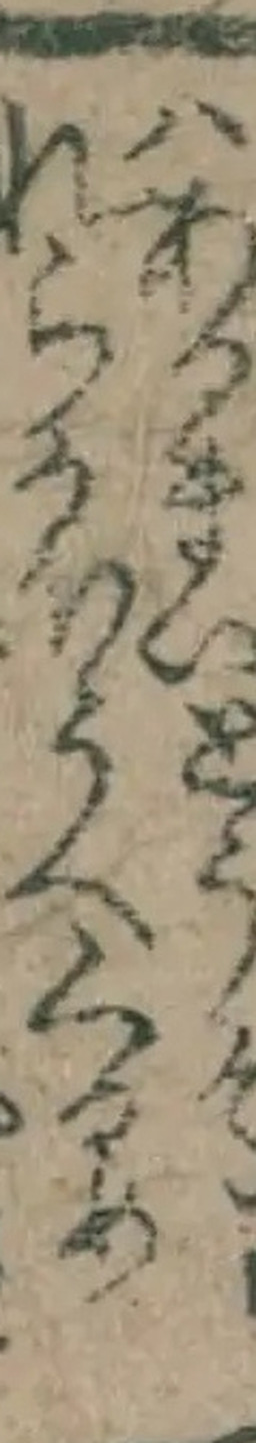れらかほうへくるめ
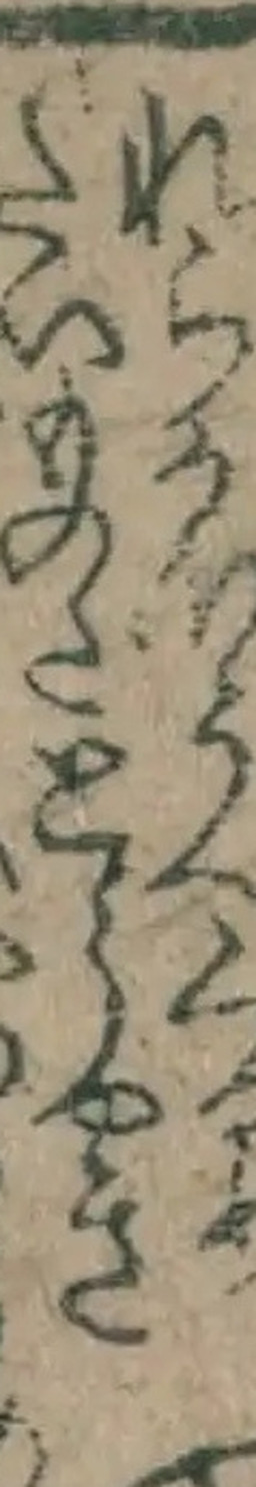たいものたとうやき
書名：団十郎蓬芥伝
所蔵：国立国会図書館 National Diet Library, JAPAN
